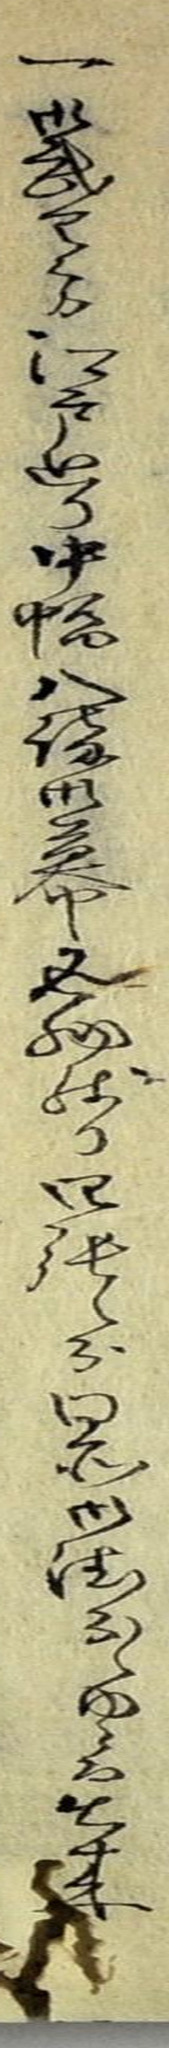一御武具方江戸廻り中幅八講御幕返納残り四張之分同所御徳分之内ニ而出来
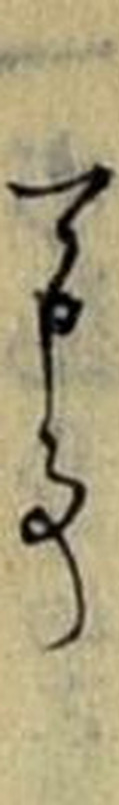可申事
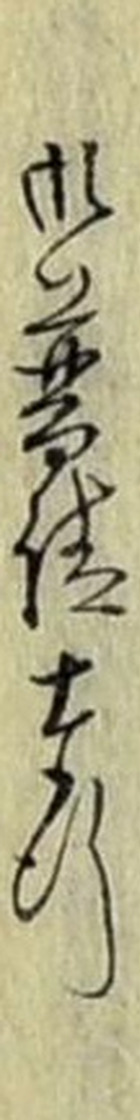御普請奉行
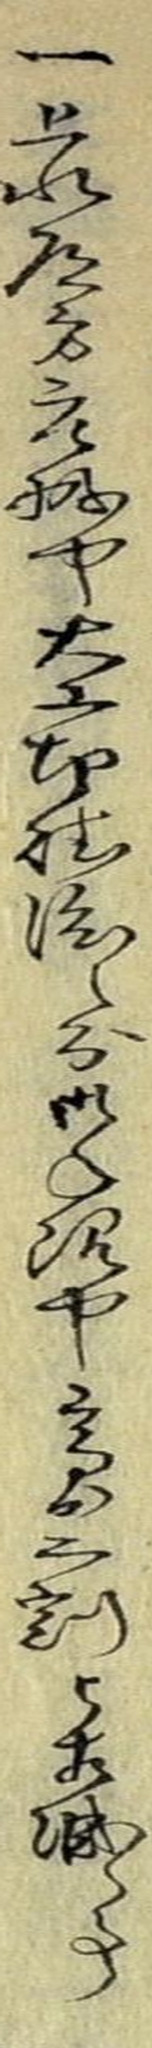一上水道方取扱中大工切賦渡之分御年限中高ゟ二割被相減候事
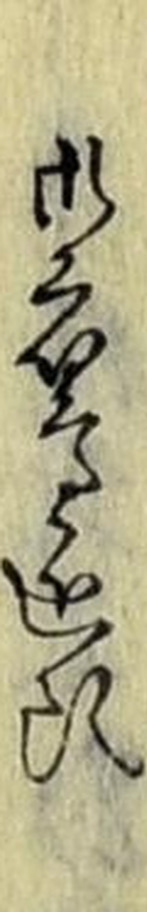御鷹匠頭
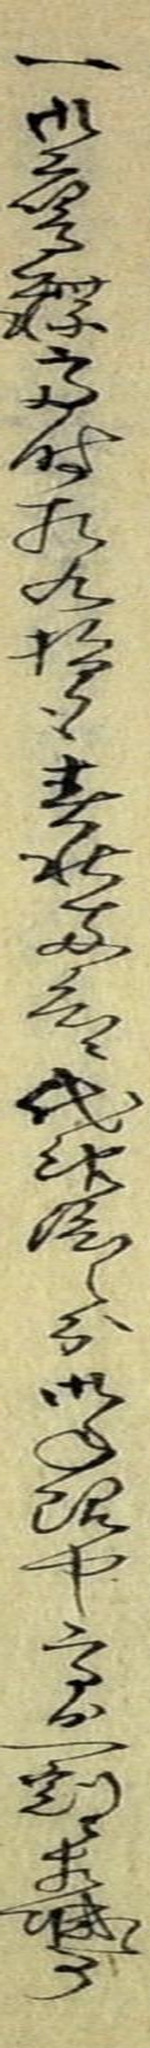一御鷹粰当時拾九指ツヽ春秋両度ニ代銀渡之分御年限中高ゟ一割被相減事
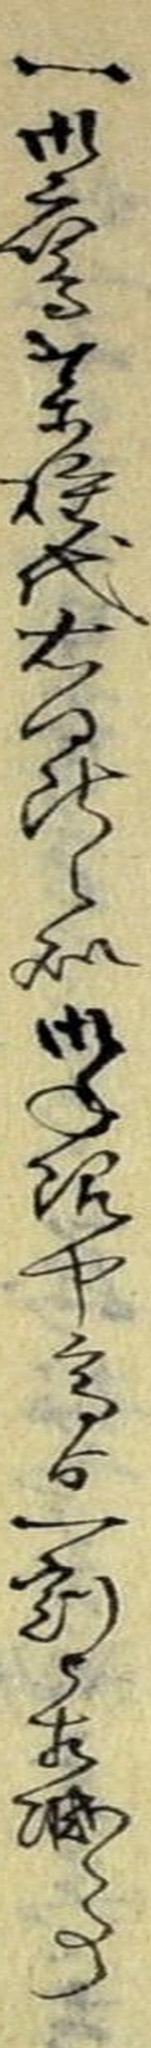一御鷹薬種代右同断之処御年限中高ゟ一割被相減事
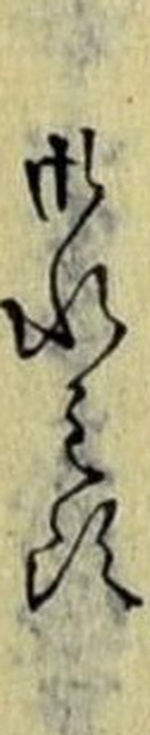御水主頭
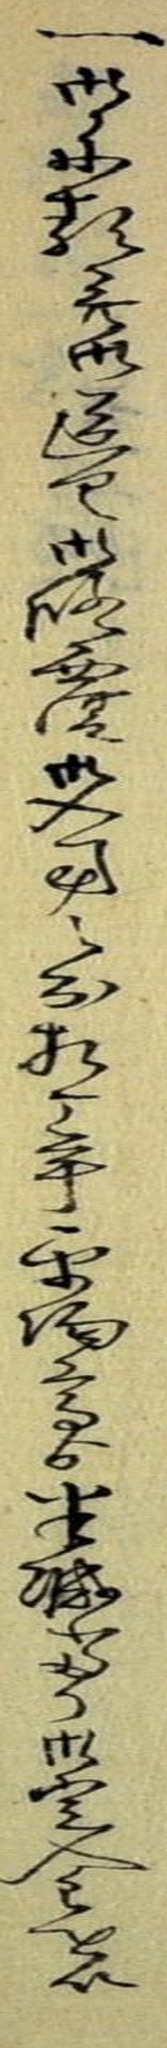一御舟類并御道具御修覆御入用之分拾ケ年平均高ゟ半減当り御定金を以
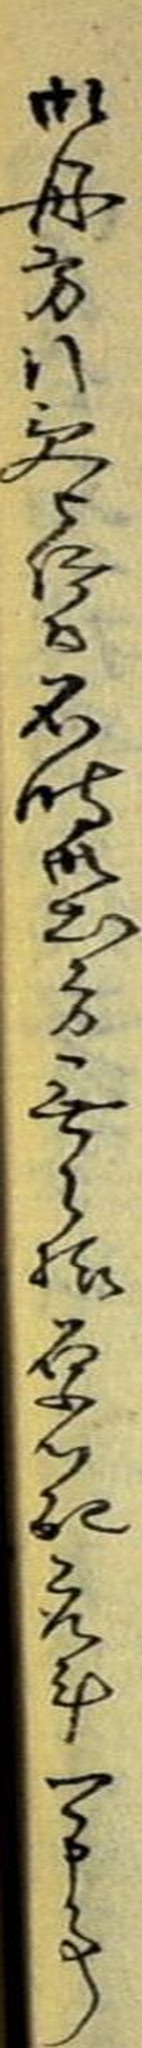御舟方引受被仰付不時御出方無之様厚心配取計可申事
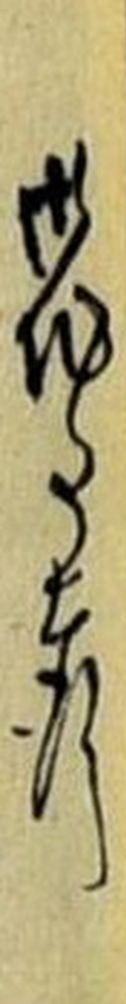御作事奉行
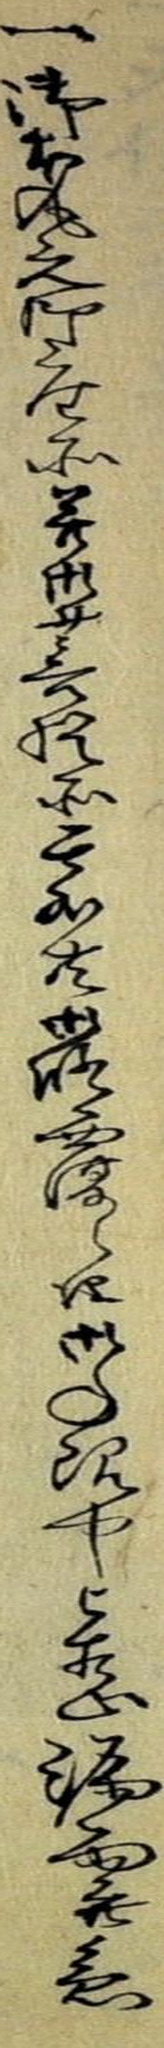一御本丸元御産所并御菩提所其外共御修覆之儀御年限中被相止漏雨并急
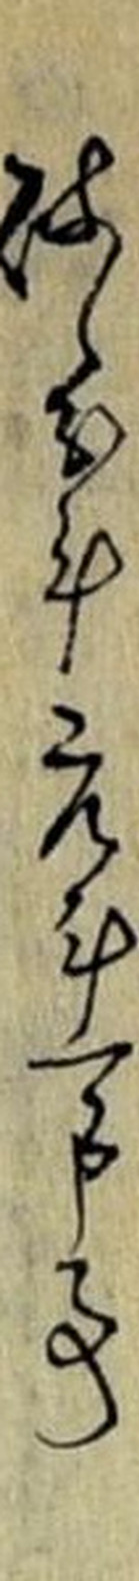破之分計取計可申事
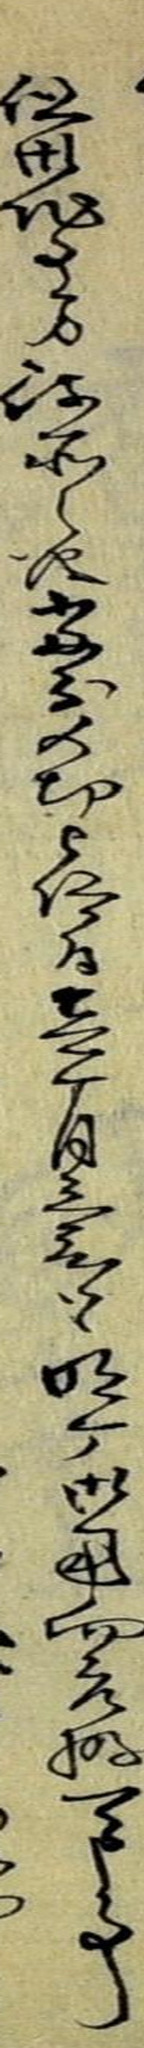但御作事方役所之儀当分〆切被仰付壱ケ月三度ツヽ明ケ御用向取扱可申事
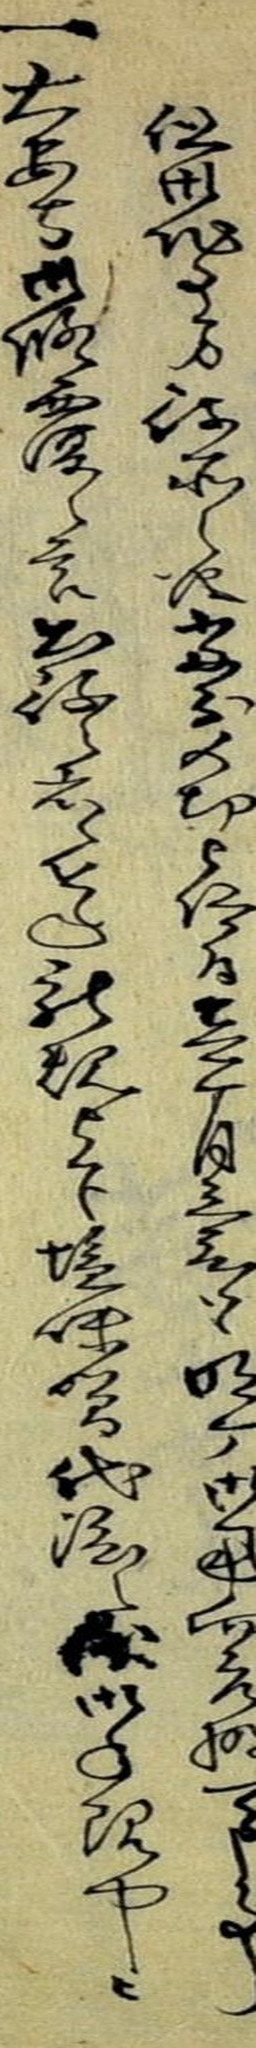一大安寺御修覆之節出役之者へ近年新規被下塩味噌代渡之儀御年限中被
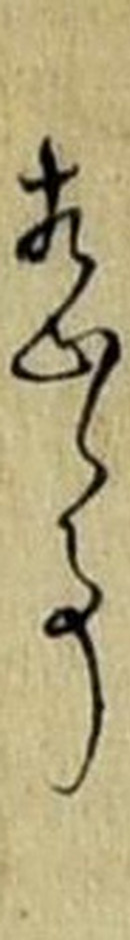相止候事
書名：命令之部 五
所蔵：福井県文書館 Fukui Prefectural Archives
